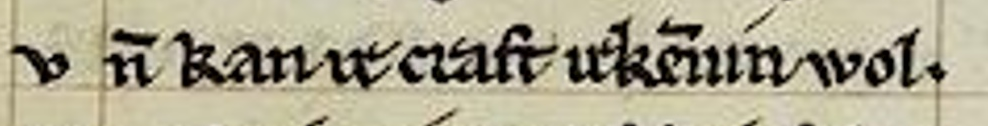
Vn(d) kan ir craft irke(n)nin wol.
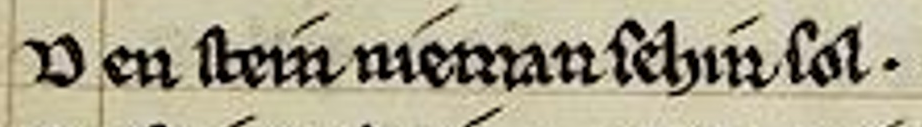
Den ſtein nieman ſehin ſol.
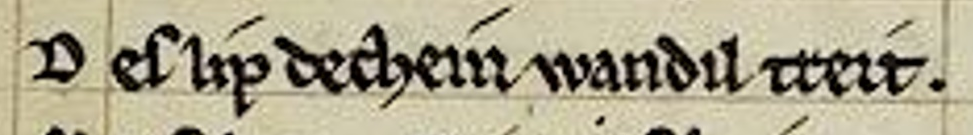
Deſ lip dechein wandil treit.
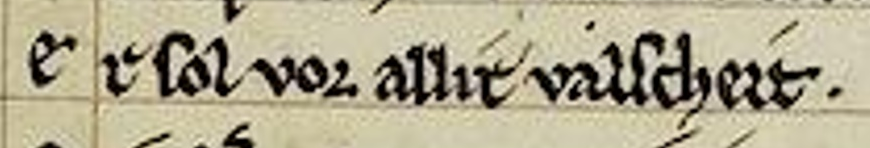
Er ſol vor allir valſcheit.
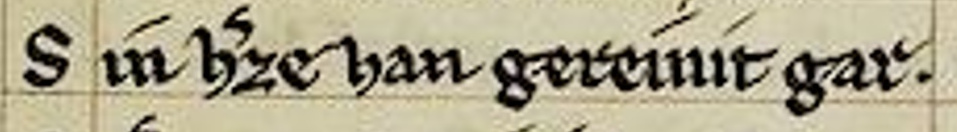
Sin h(er)ze han gereinit gar.
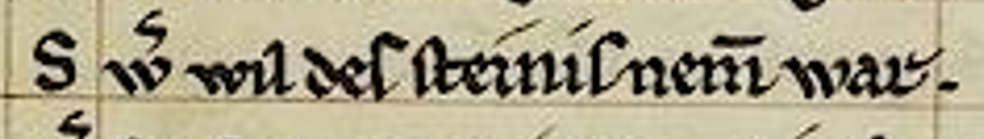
Sw(er) wil deſ ſteiniſ nem(n) war.
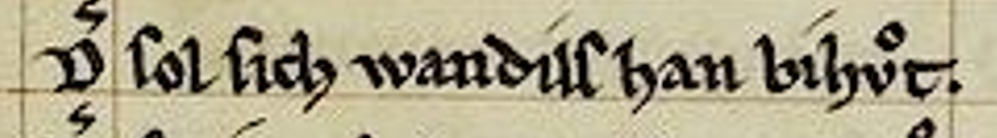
D(er) ſol ſich wandilſ han bihv°ot.
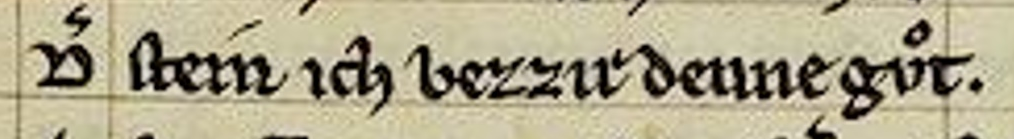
D(er) ſtein ich bezzir denne gv°ot.
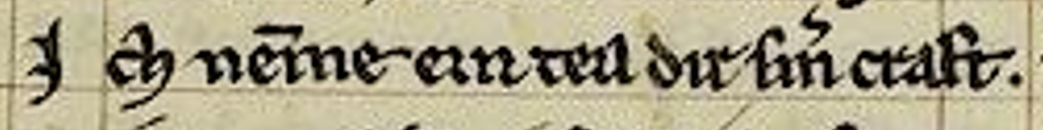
Ich ne(m)me ein teil dir ſin(er) craft.
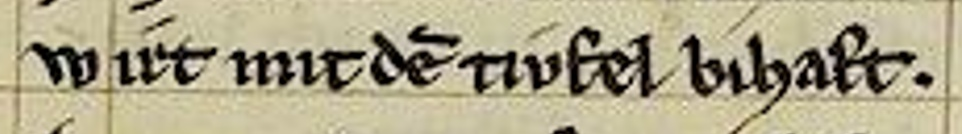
Wirt mit de(m) tivfel bihaft.
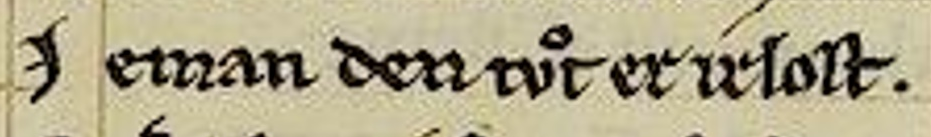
Ieman den tv°ot er irloſt.
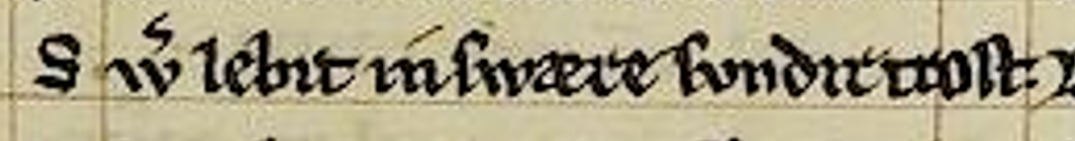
Sw(er) lebit in ſw[ae]re ſvndir troſt.
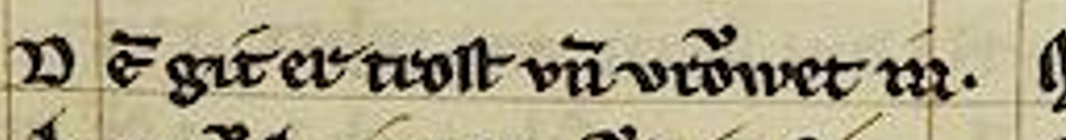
De(m) git er troſt vn(d) vro°vwet in.
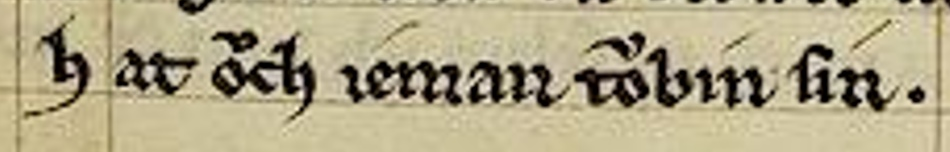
Hat o°vch ieman to°vbin ſin.
